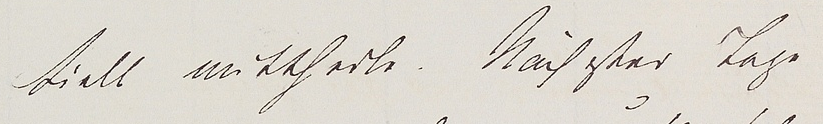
tiell mittheile. Nächster Tage
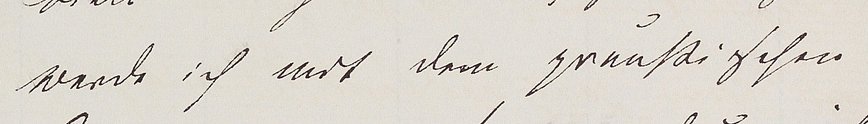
werde ich mit dem preußischen
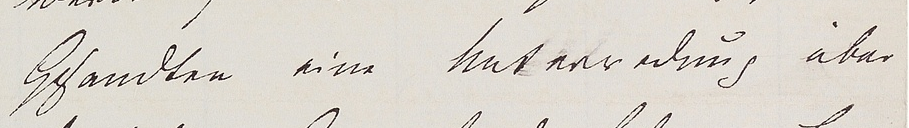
Gesandten eine Unterredung über
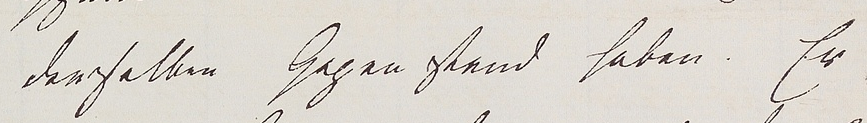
denselben Gegenstand haben. Er
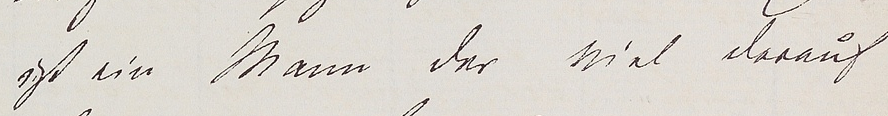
ist ein Mann der viel darauf
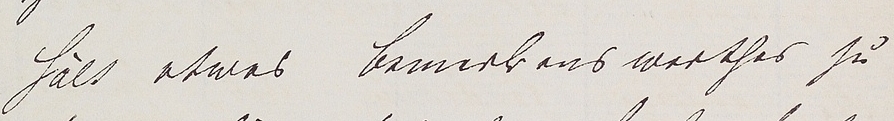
hält etwas Bemerkenswerthes zu
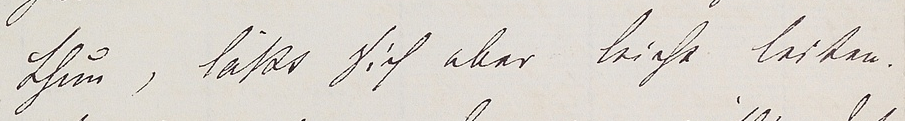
thun, läßt sich aber leicht leiten.
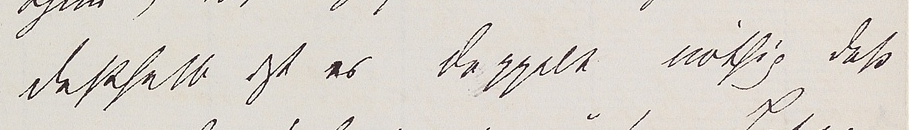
Deßhalb ist es doppelt nöthig daß
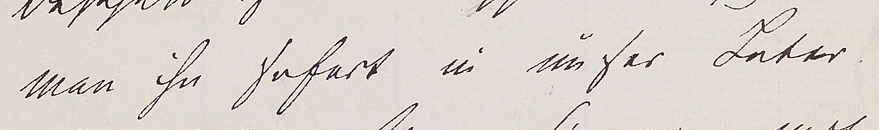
man ihn sofort in unser Inter-
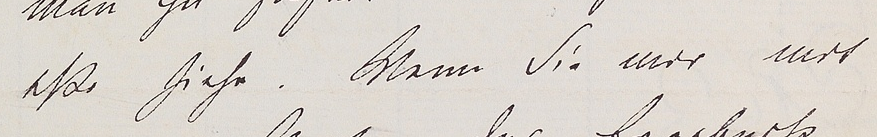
eße ziehe. Wenn Sie mir mit
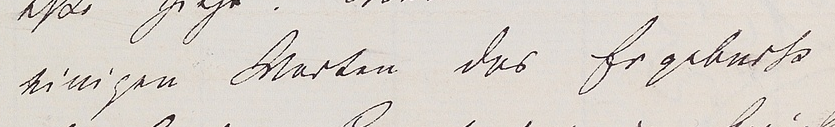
einigen Worten das Ergebniß
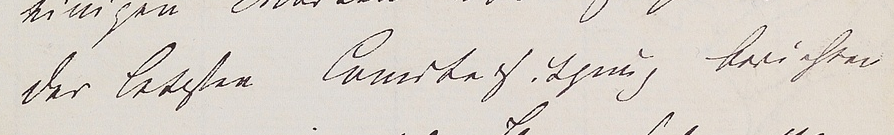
der letzten Comitesitzung berichten
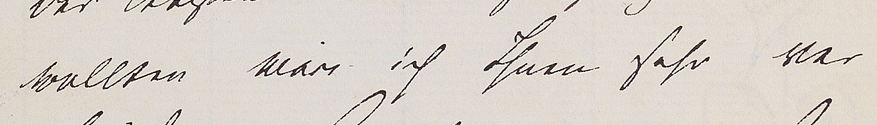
wollten wäre ich Ihnen sehr ver-
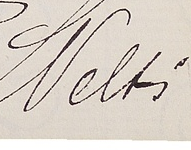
Welti
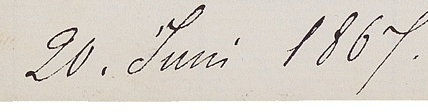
20. Juni 1867.
